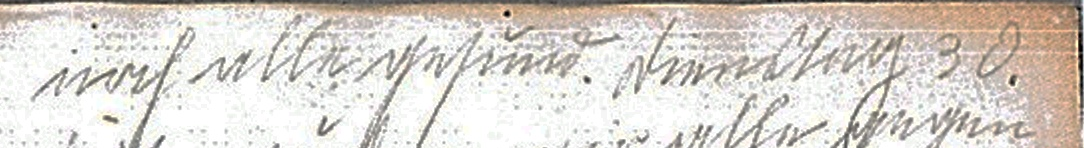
noch alle gesund. Dienstag 30.
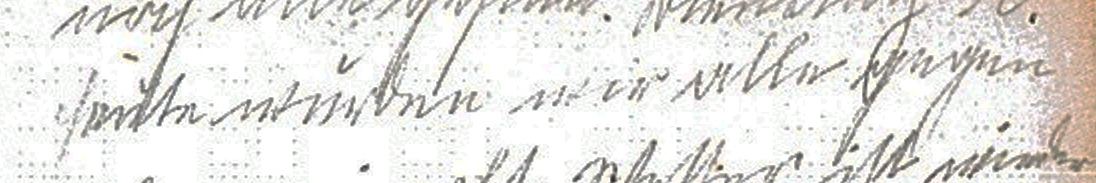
Heute wurden wir alle gegen
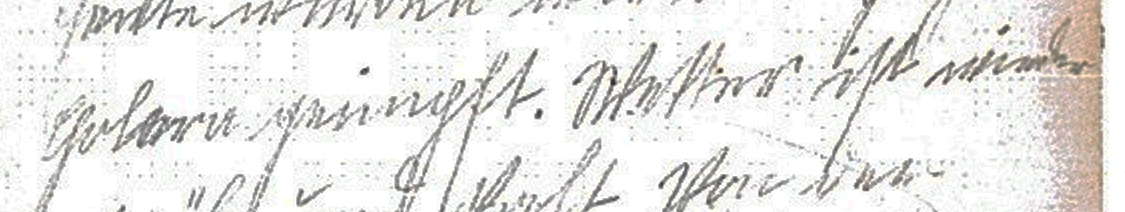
Cholera geimpft. Wetter ist wieder trüb und kalt. Von der
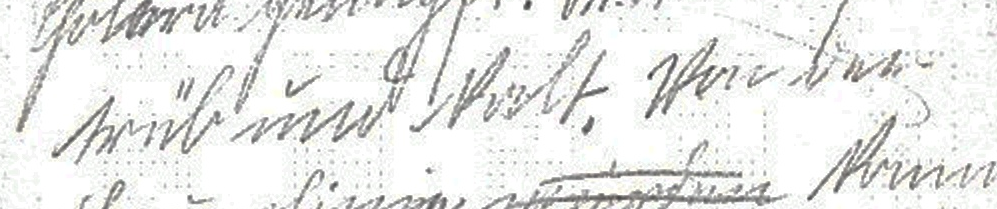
Feuerlinie kommen
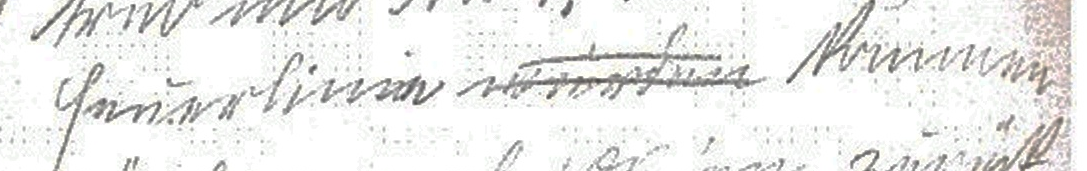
täglich noch 100en zurück,
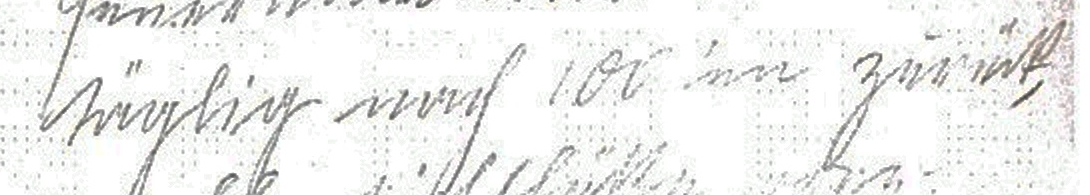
welche sich Füße oder
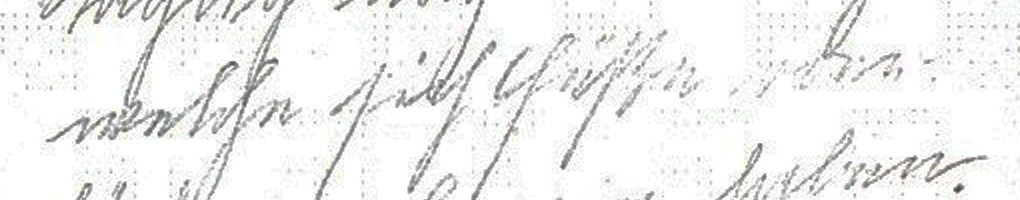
Hände erfroren haben.
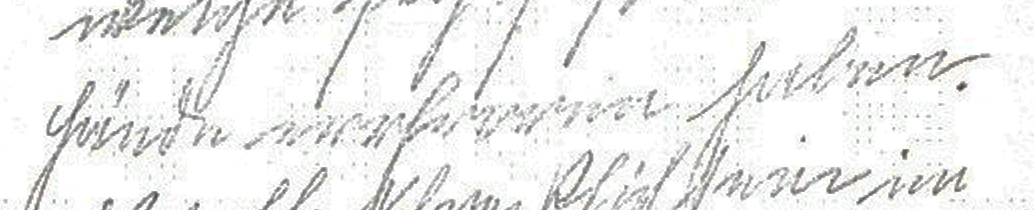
Es soll schrecklich sein in
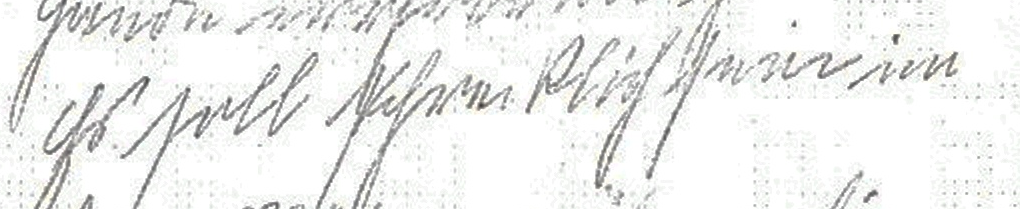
den Schützengräben, die
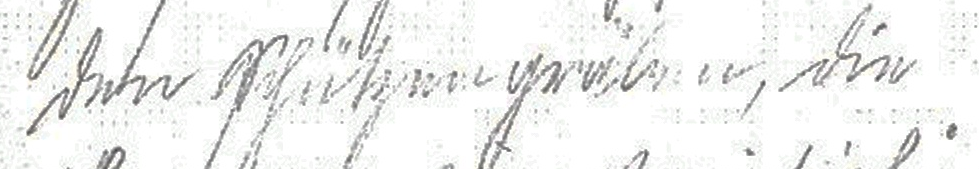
Leute stehen knietief im
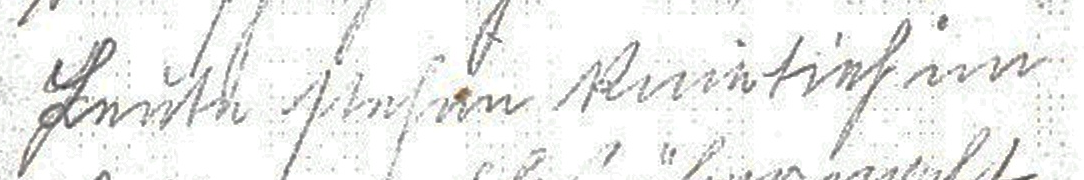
Wasser welcges üebr nacht
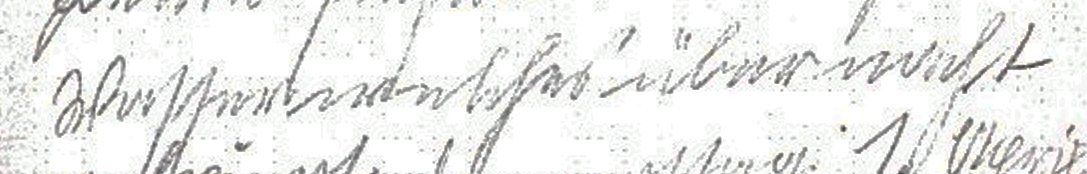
gefriert. Donnerstag 1. April
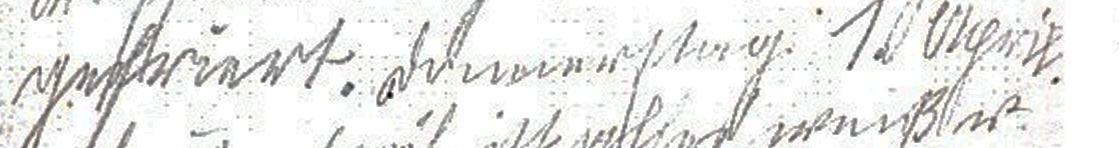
Heute früh ist alles weiß v
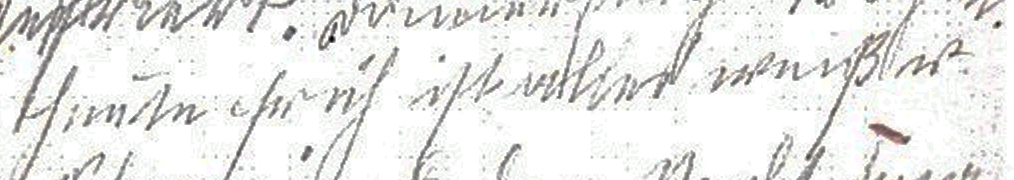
Schnee in der Nacht fing
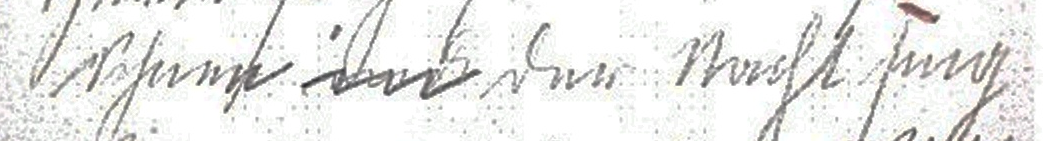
es an zu schneien. Es ist
